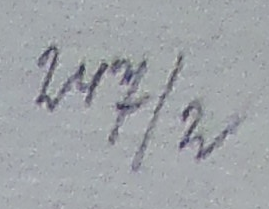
247/2
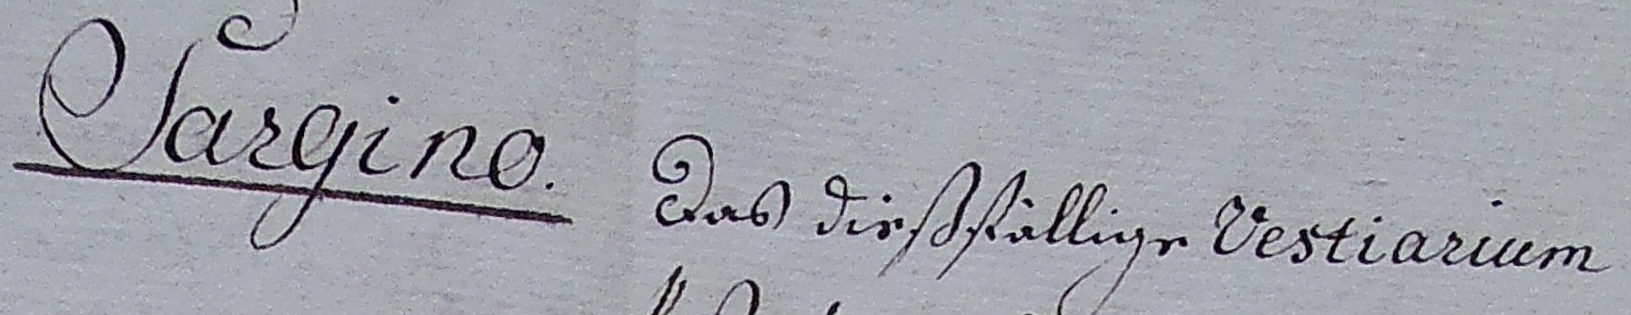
Sargino. Das dießfällige Vestiarium
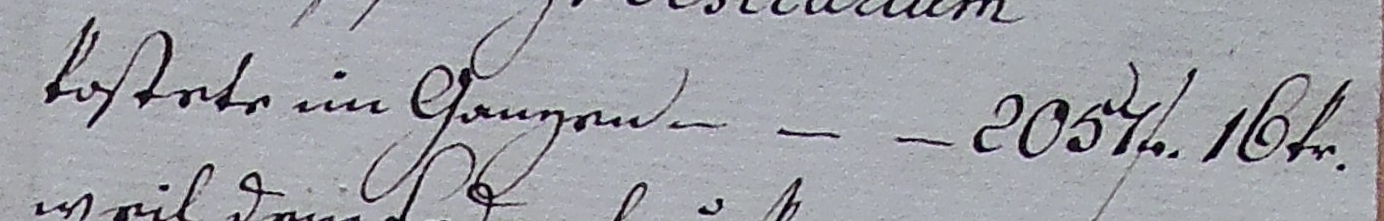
kostete im Ganzen _ _ _ 2057fr. 16kr.
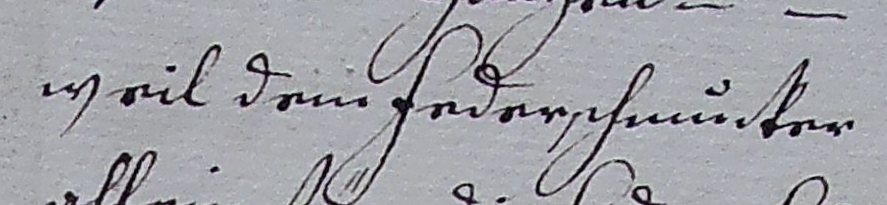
weil dem Federschmucker
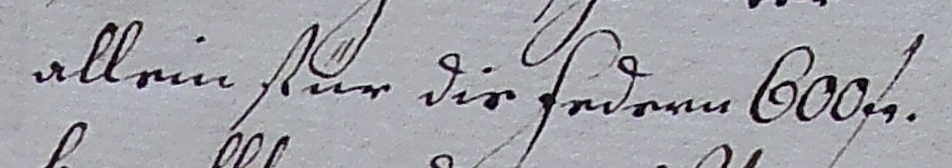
allein für die Federn 600fr.
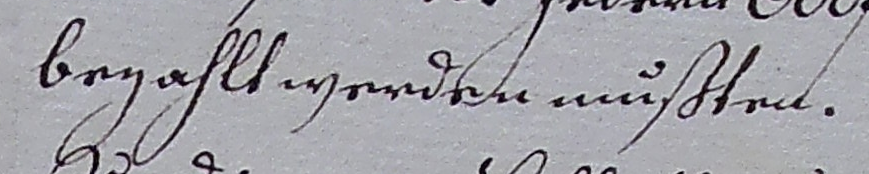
bezahlt werden mußten.
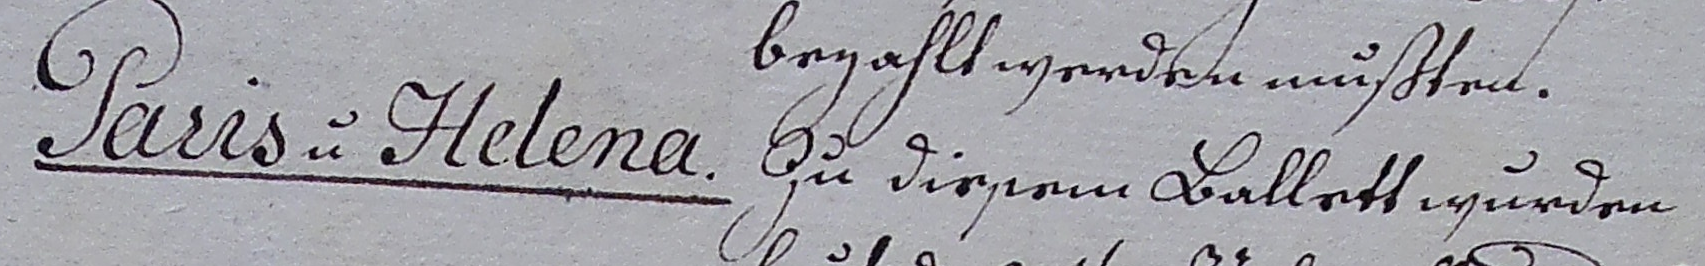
Paris u Helena. Zu diesem Ballet wurden
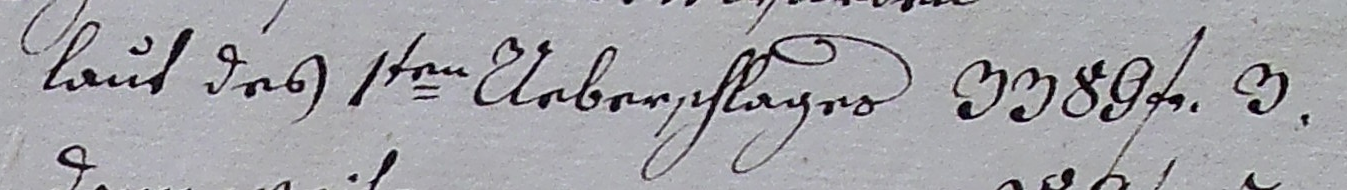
laut des 1te͇n Ueberschlages 3389fr. 3.
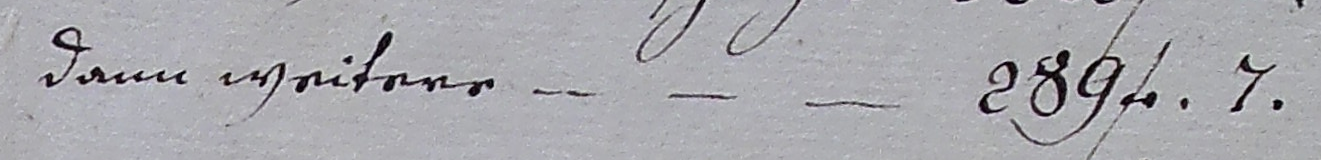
dann weitere __ __ __ 289fr. 7.
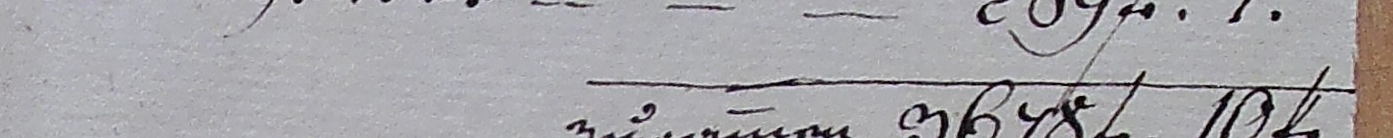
----------------------------------
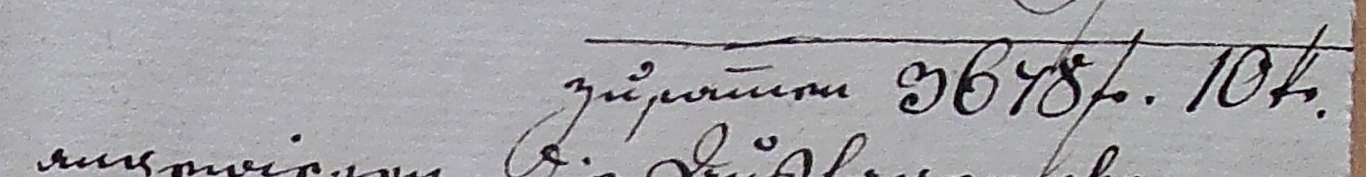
zusam̅en 3678fr. 10kr.
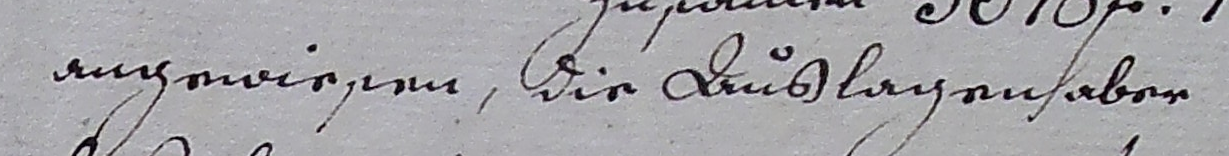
angewiesen, die Auslagen aber
